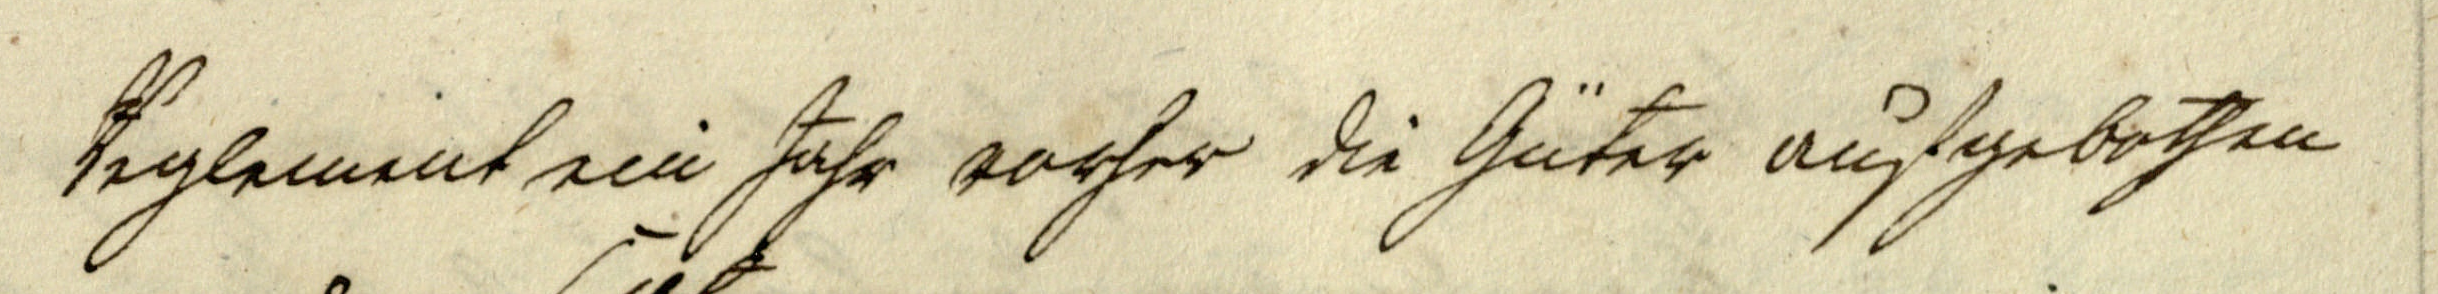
Reglement ein Jahr vorher die Güter aufgebothen
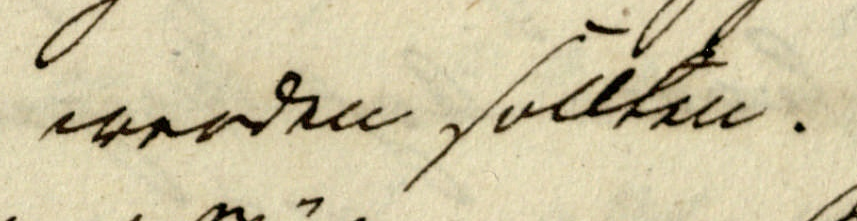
werden sollten.
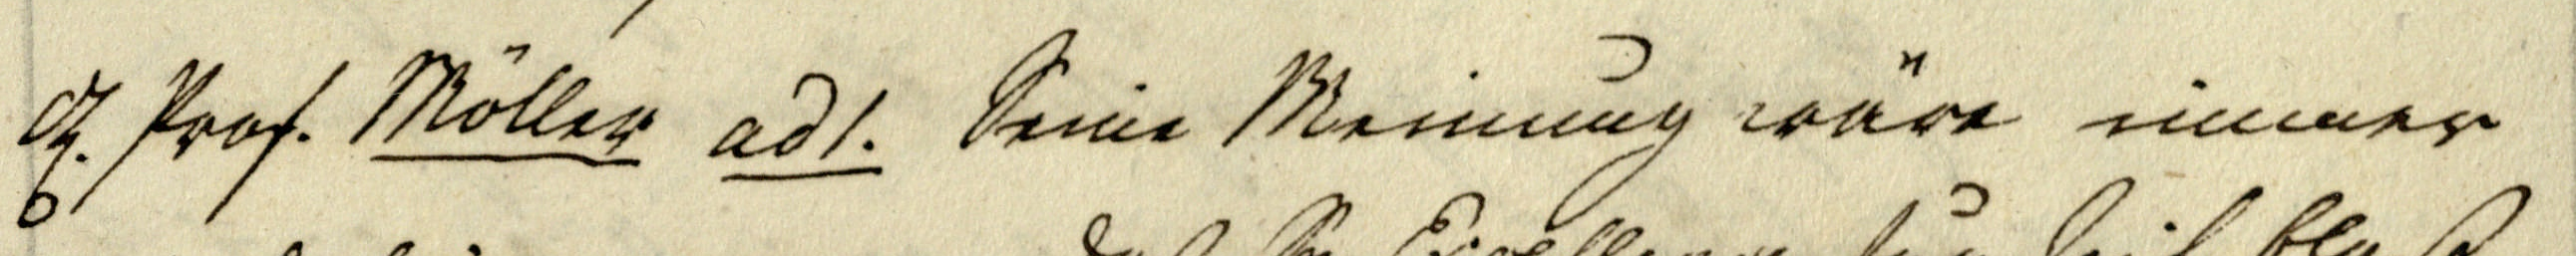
dh. Prof. Möller ad 1. Seine Meinung wäre immer
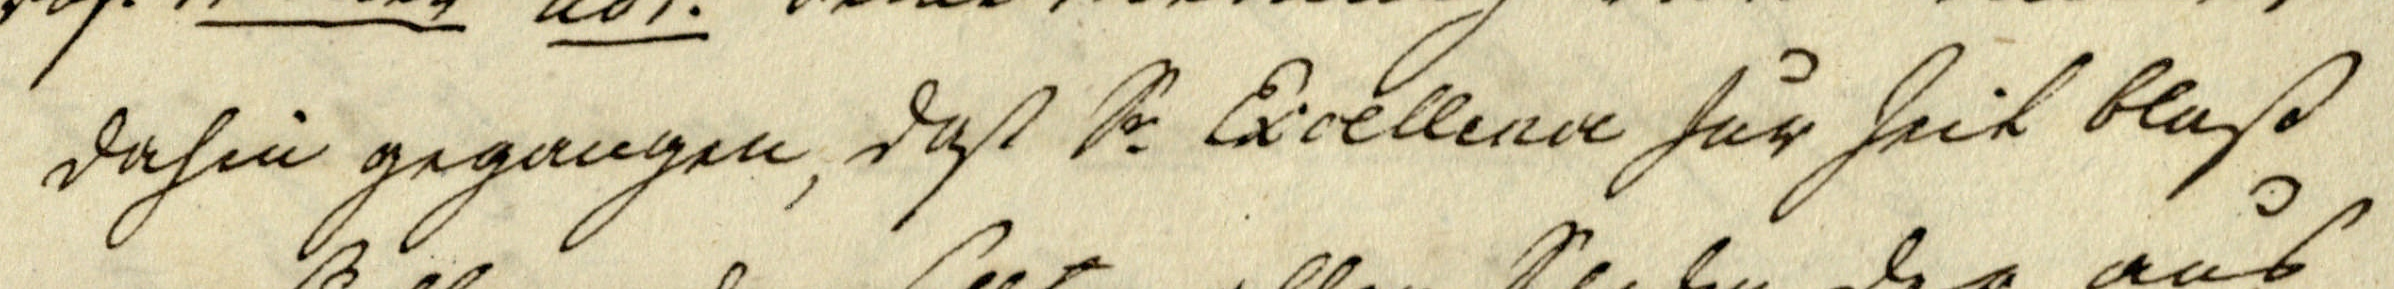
dahin gegangen, daß Sr Excellence zur Zeit bloß
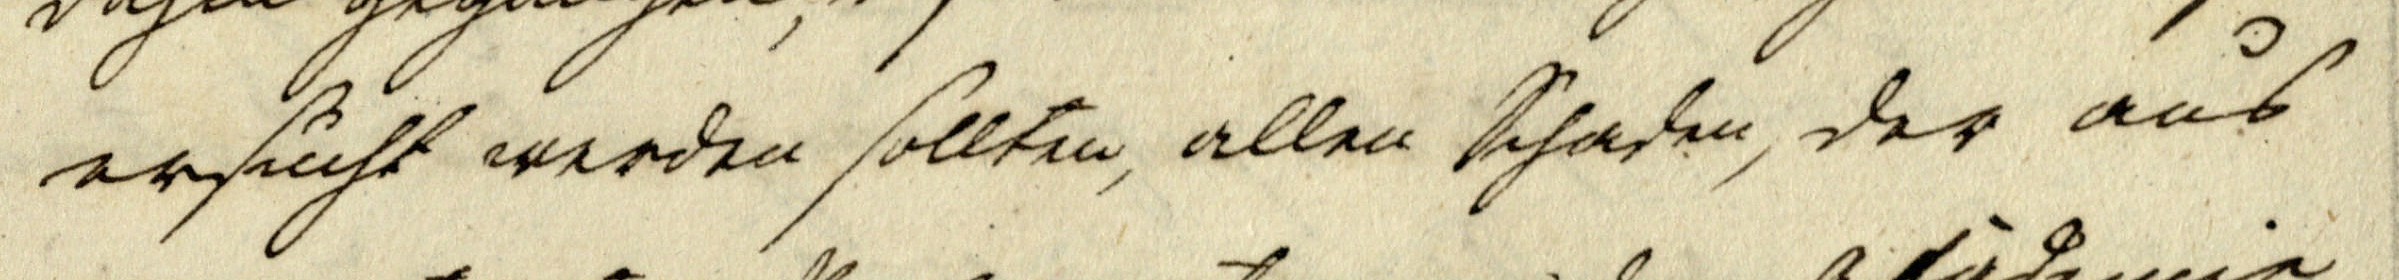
ersucht werden sollten, allen Schaden, der aus
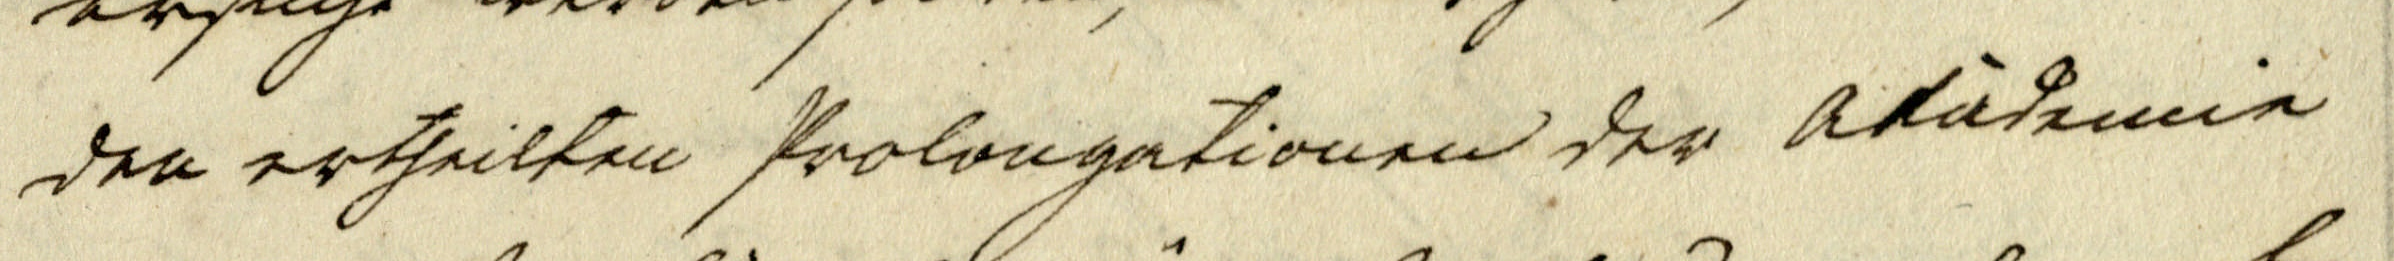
den ertheilten Prolongationen der Akademie
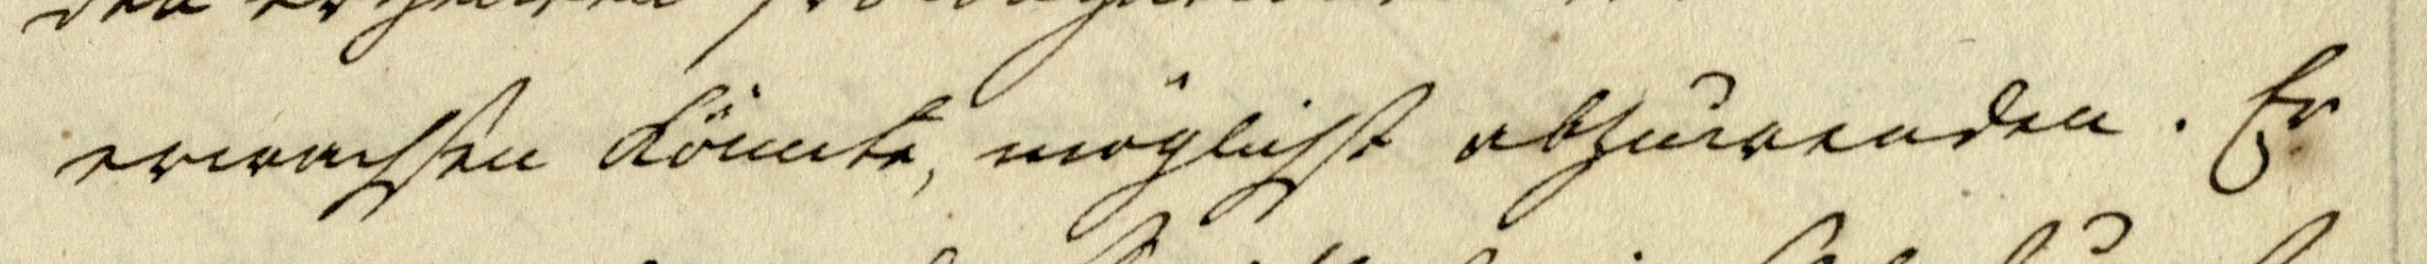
erwachsen könnte, möglichst abzuwenden. Er
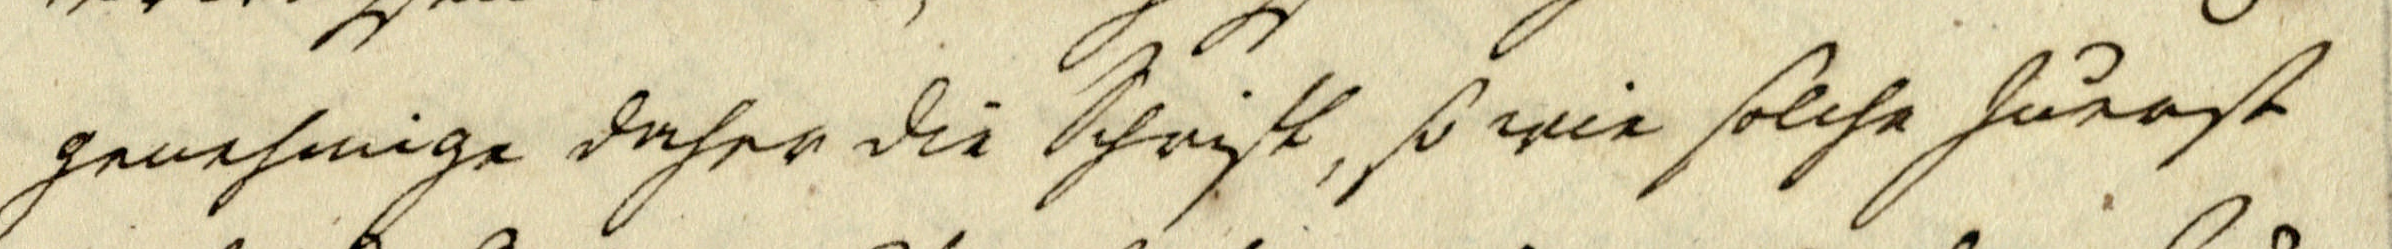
genehmige daher die Schrift, so wie solche zuerst
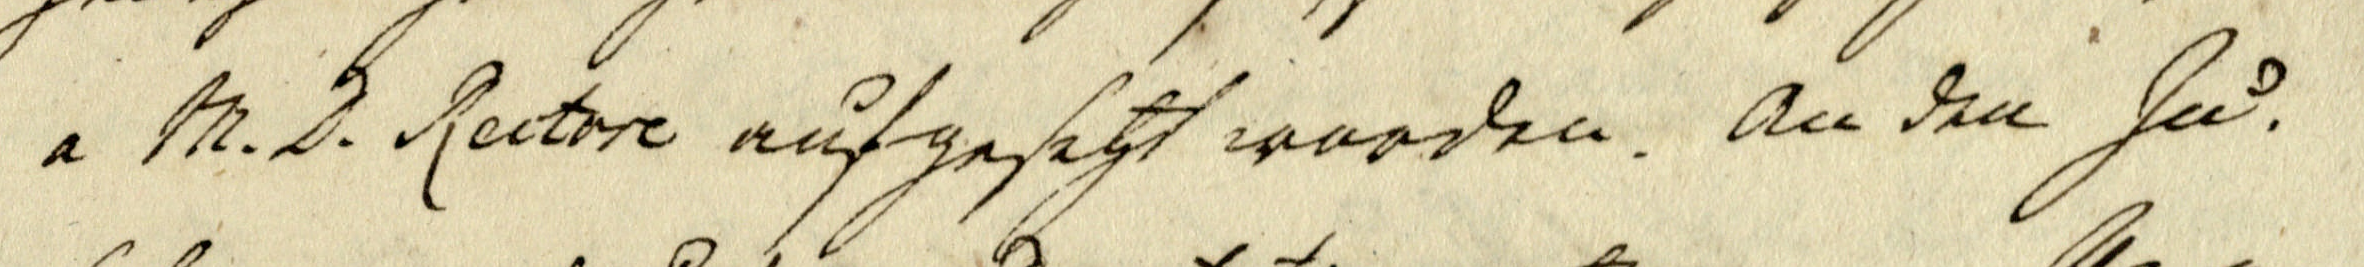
a M. D. Rectore aufgesetzt worden. An den Zu¬
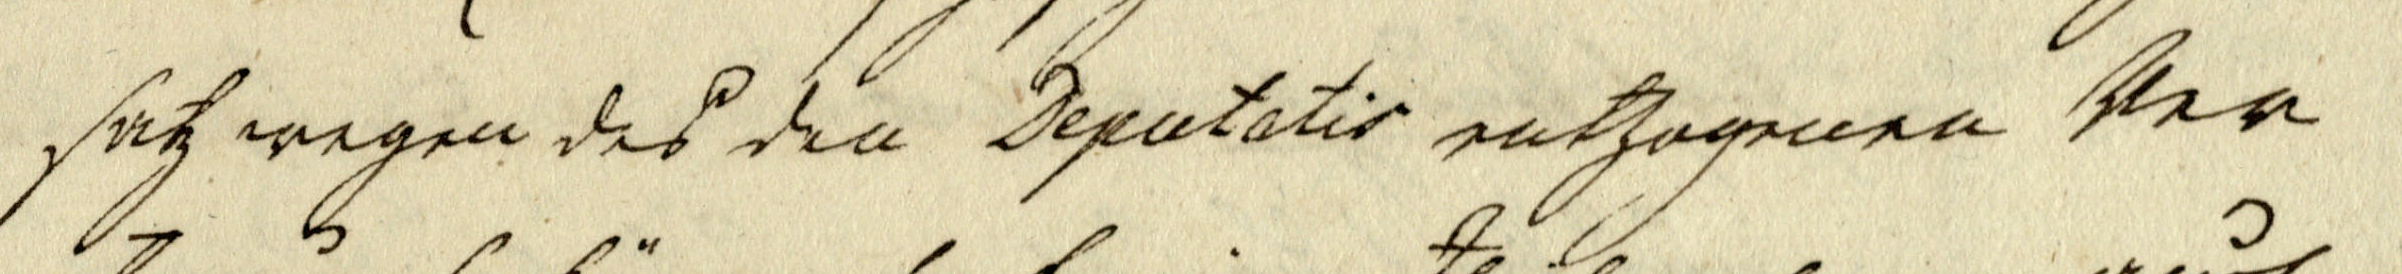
satz wegen des den Deputatis entzogenen Ver¬
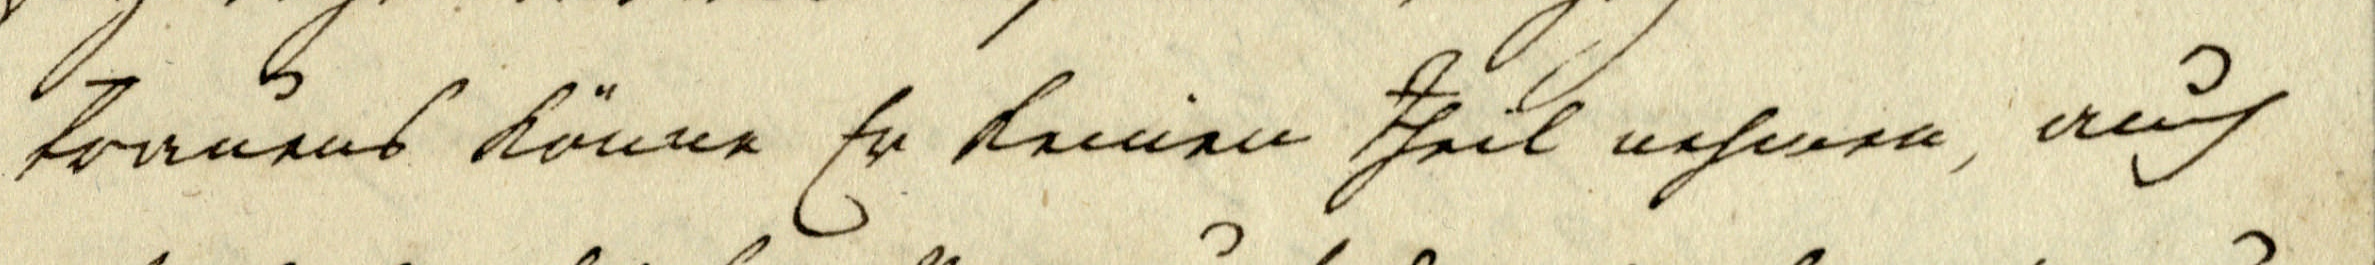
trauens könne Er keinen Theil nehmen, auch
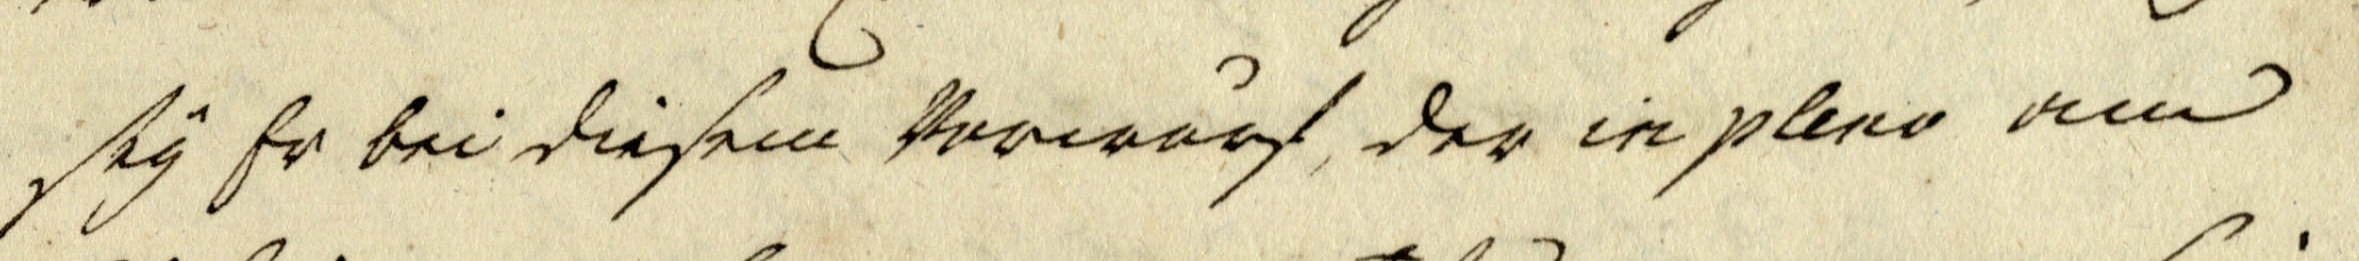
seÿ Er bei diesem Vorwurf, der in pleno am
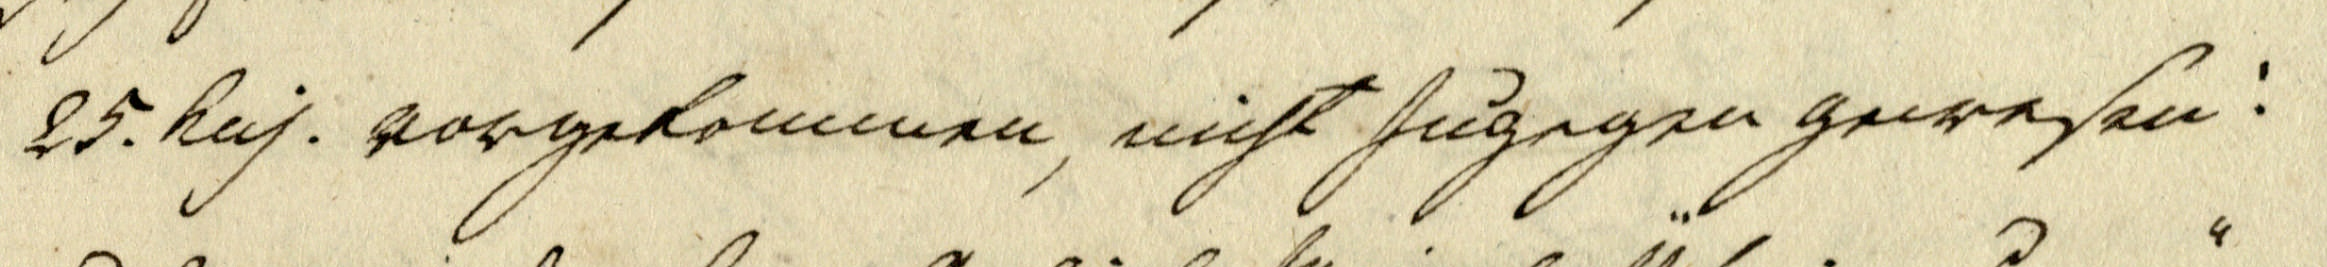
25. huj. vorgekommen, nicht zugegen gewesen.
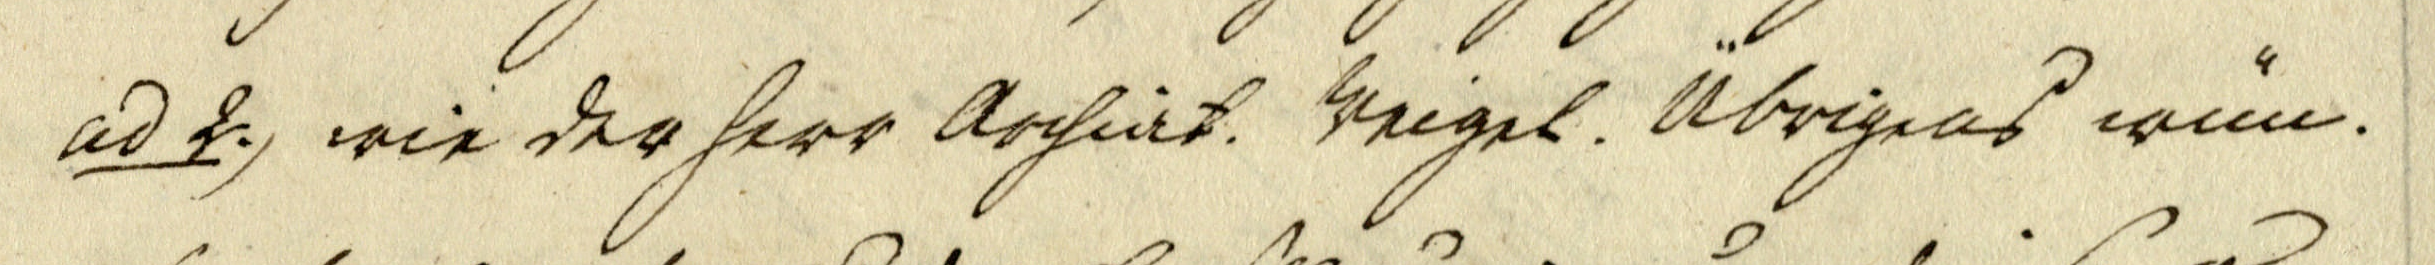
ad 2., wie der Herr Archiat. Weigel. Übrigens wün¬
